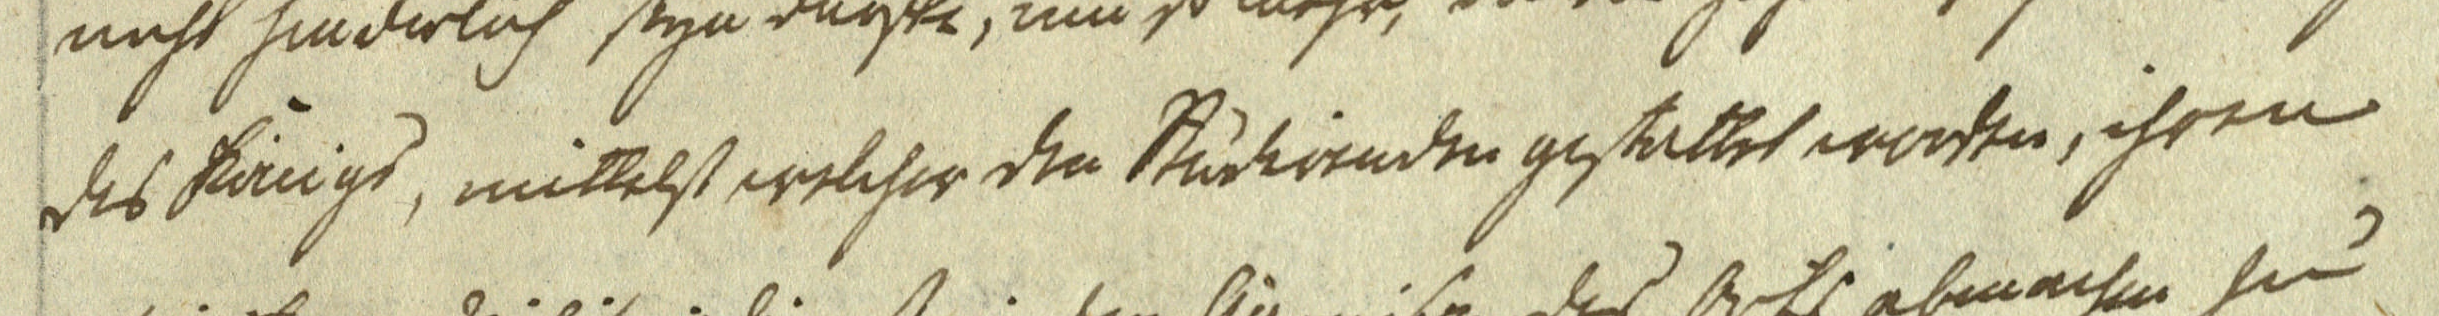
des Königs, mittelst welcher den Studirenden gestattet worden, ihren
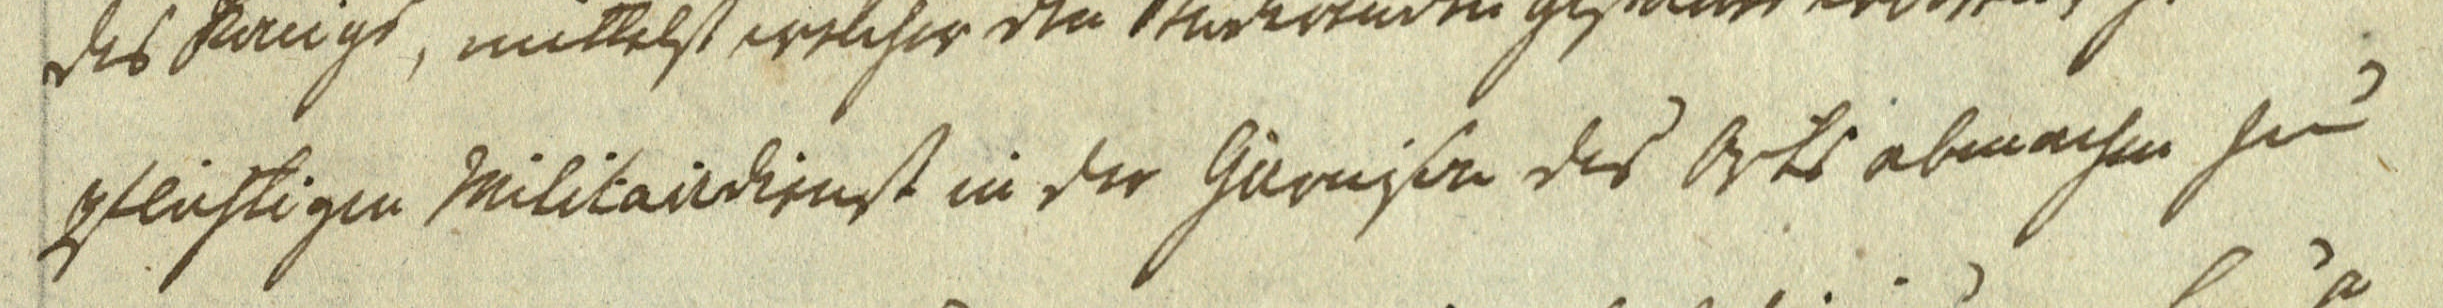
pflichtigen Militairdienst in der Garnison des Orts abmachen zu
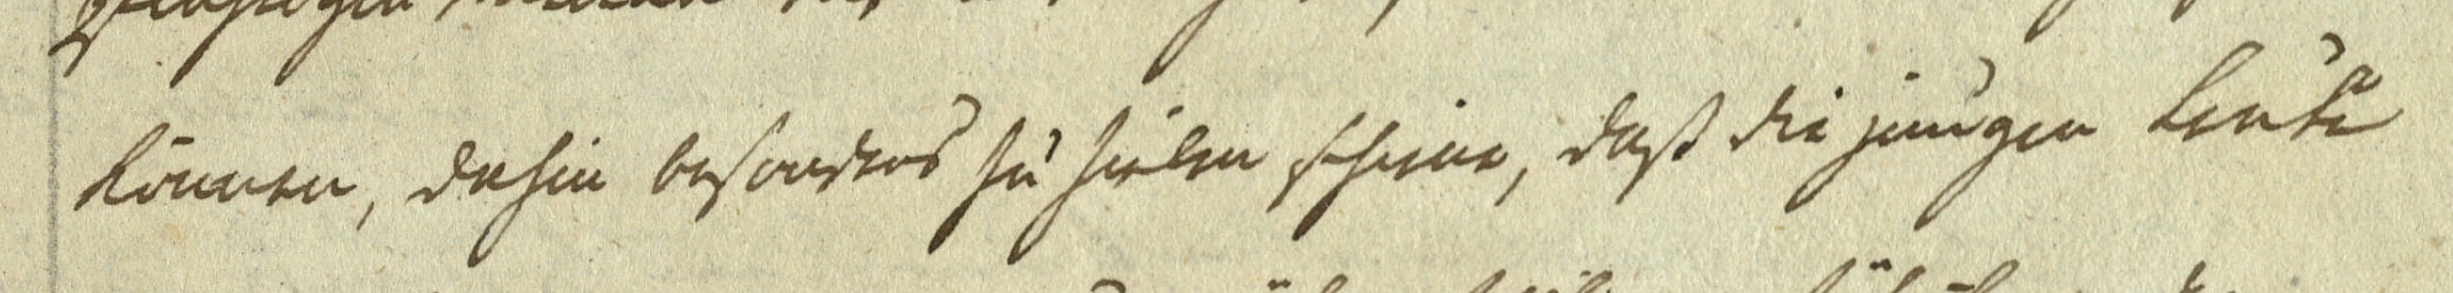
können, dahin besonders zu zielen scheine, daß die jungen Leute
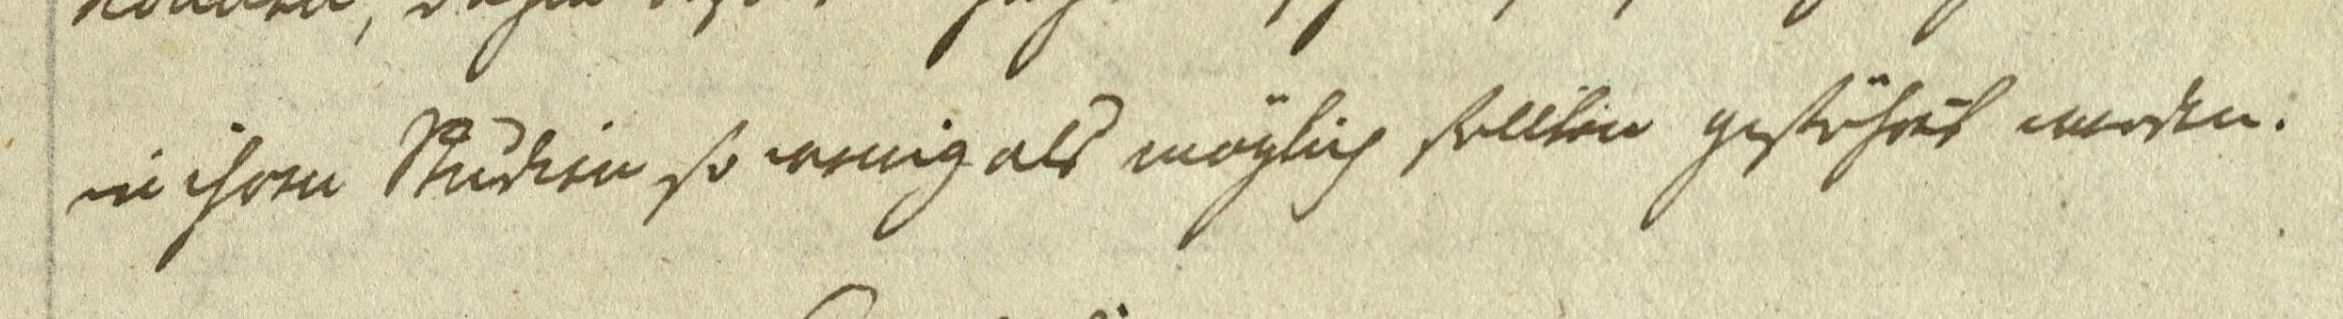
in ihren Studien sowenig als möglich sollten gestöhret werden.
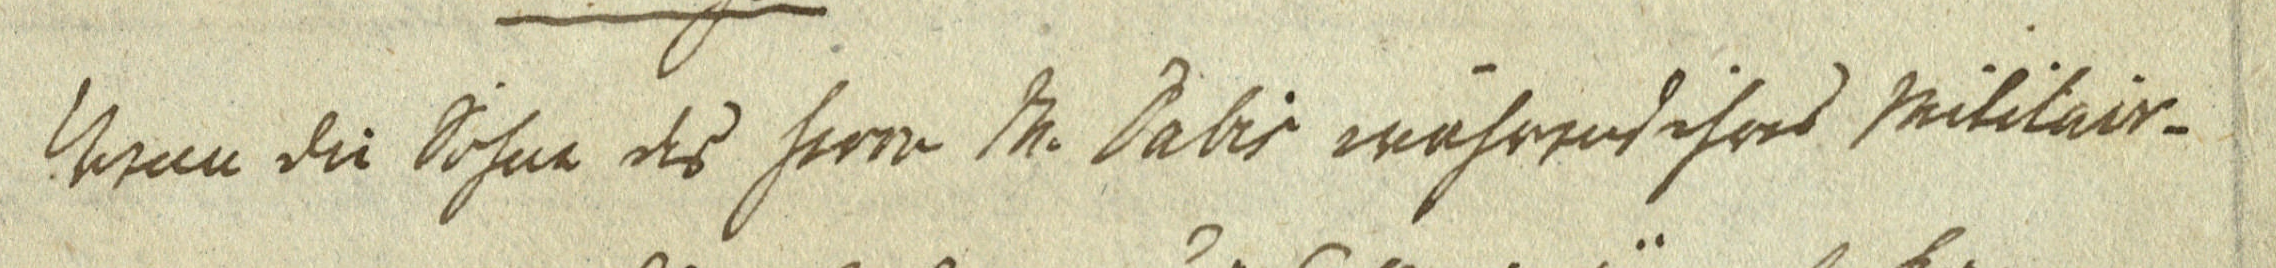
Wenn die Söhne des Herrn M. Dabis während ihres Militair¬
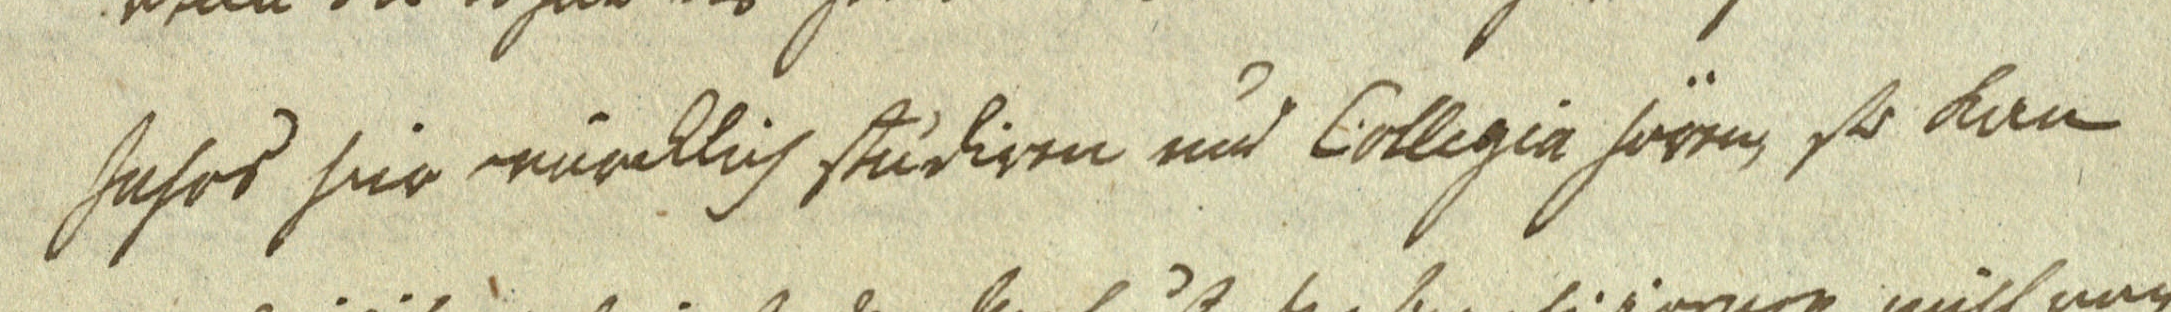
Jahrs hier würcklich studiren und Collegia hören, so kan
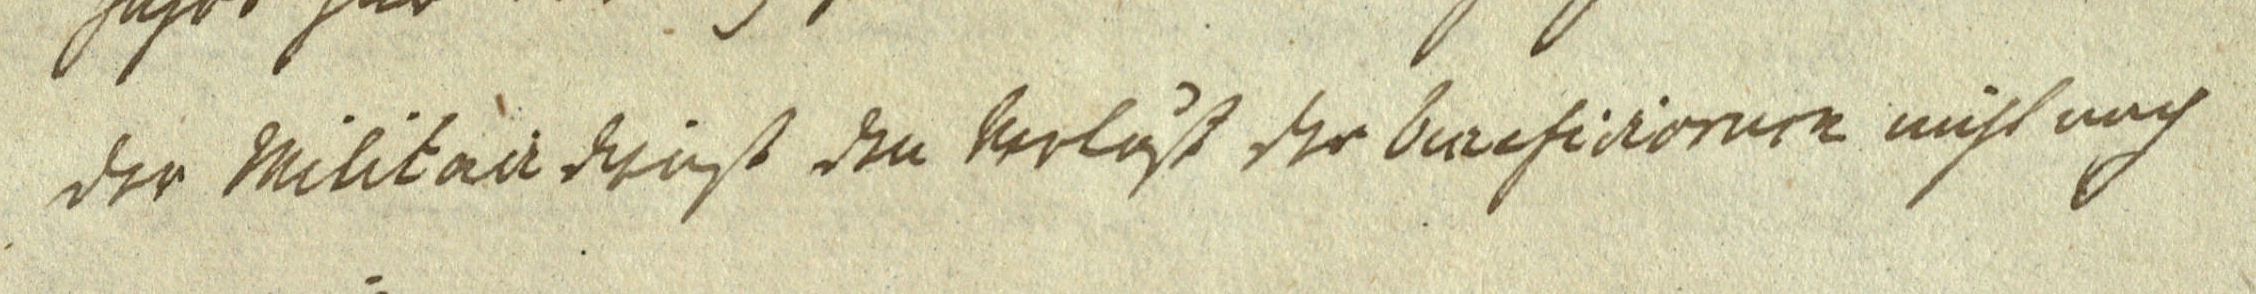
der Militairdienst den Verlust der beneficiorum nicht nach
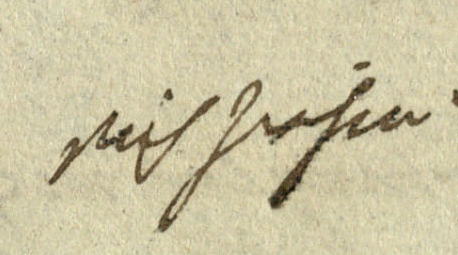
sich ziehen.
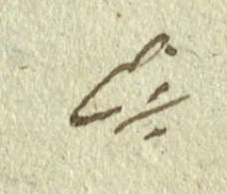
E
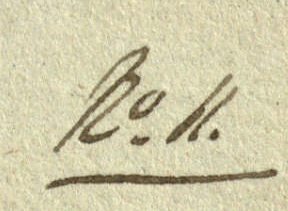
Nº 11.
